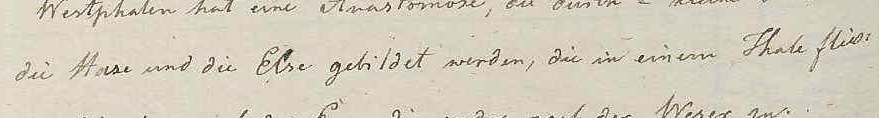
die Hase und die Else gebildet werden, die in einem Thale flies-
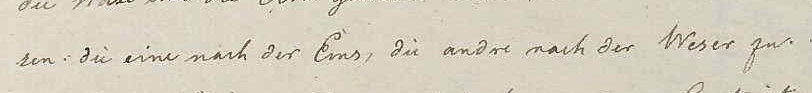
sen: die eine nach der Ems, die andre nach der Weser zu.
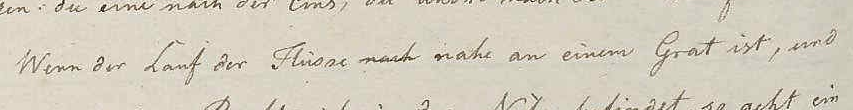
Wenn der Lauf der Flüsse nach nahe an einem Grat ist, und
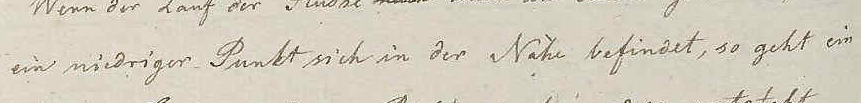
ein niedriger Punkt sich in der Nähe befindet, so geht ein
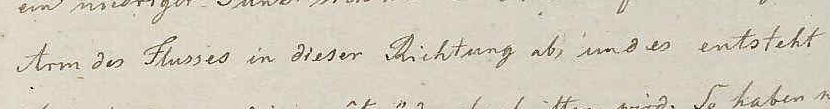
Arm des Flusses in dieser Richtung ab, und es entsteht
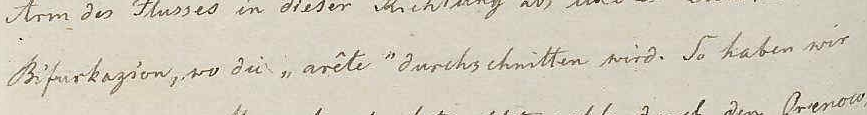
Bifurkazion, wo die „arête” durchschnitten wird. So haben wir
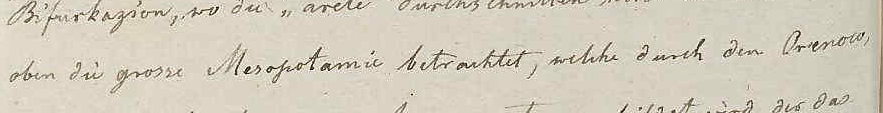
oben die grosse Mesopotamie betrachtet, welche durch den Orenoco,
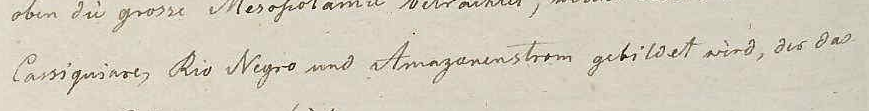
Cassiquiare, Rio Negro und Amazonenstrom gebildet wird, der das
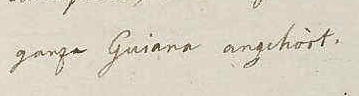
ganze Guiana angehört.
